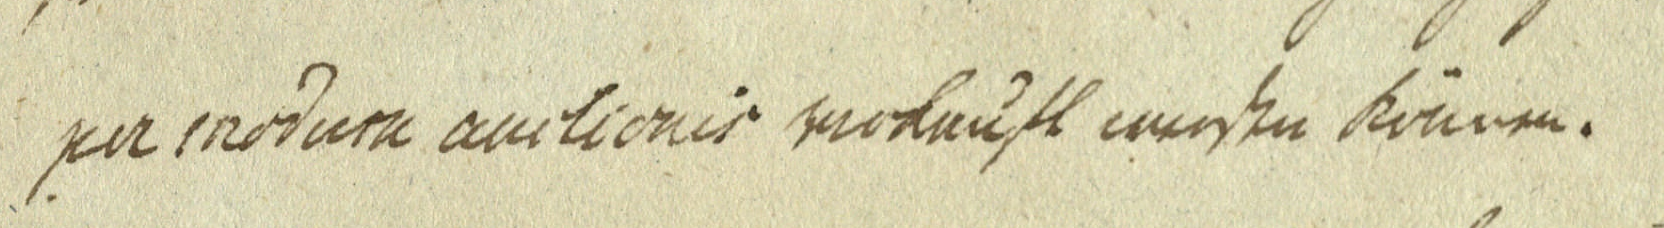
per modum auctionis verkauft werden können.
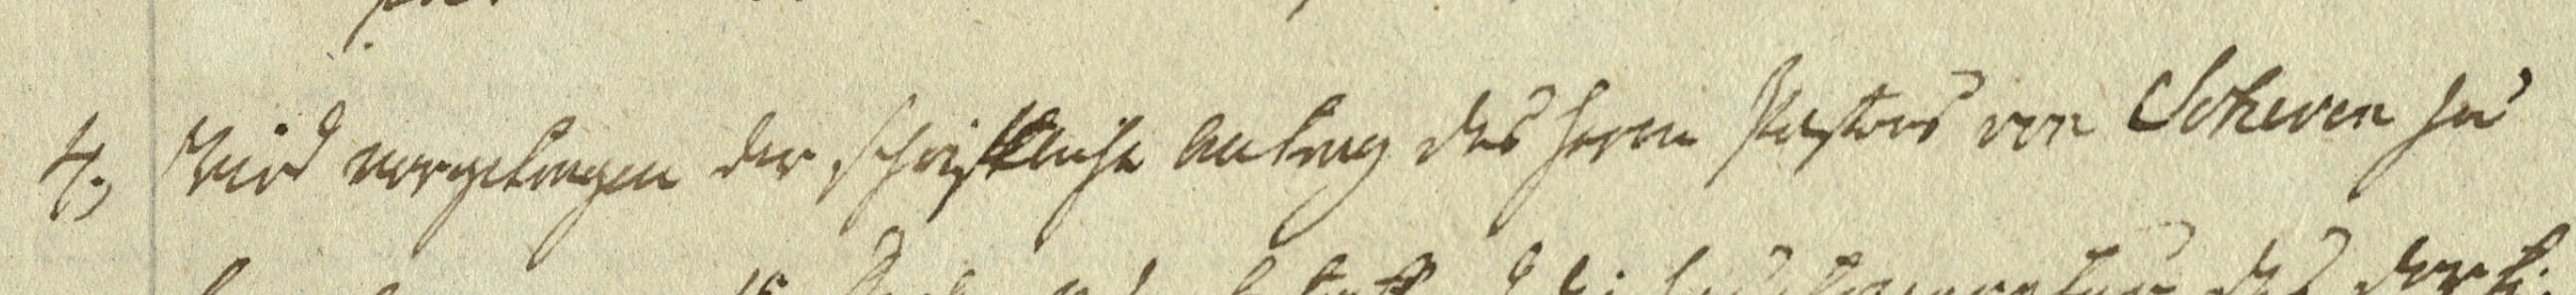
4., Wird vorgetragen der schriftliche Antrag des Herrn Pastors von Scheven zu
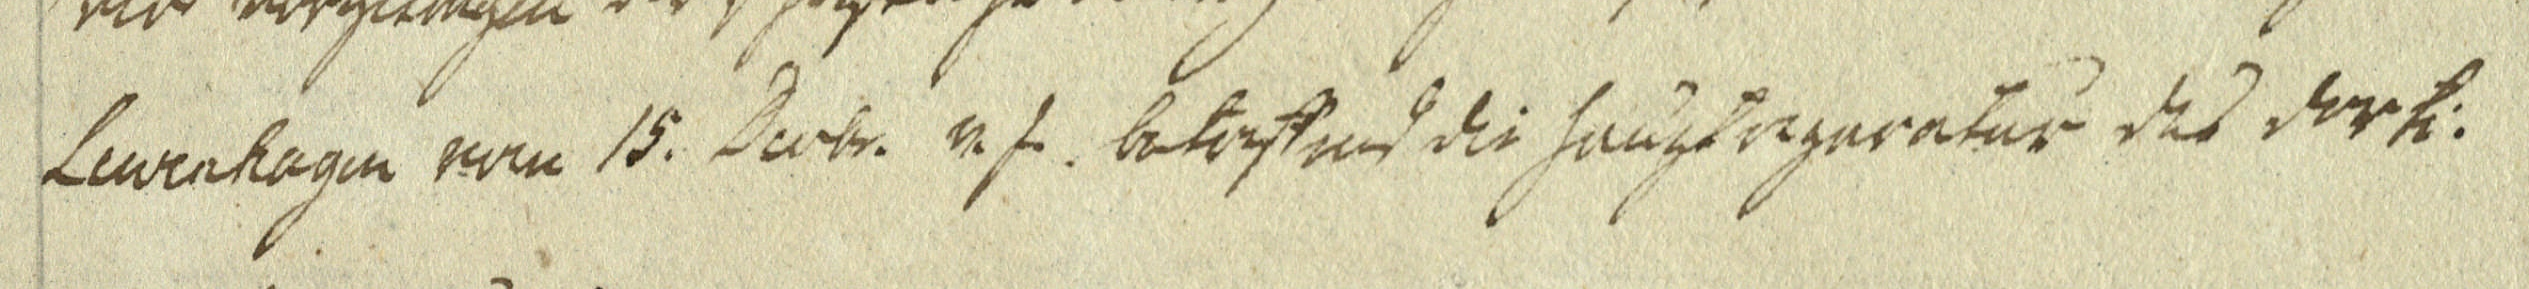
Lewenhagen vom 15. Decbr. v. J. betreffend die Hauptreparatur des dorti¬
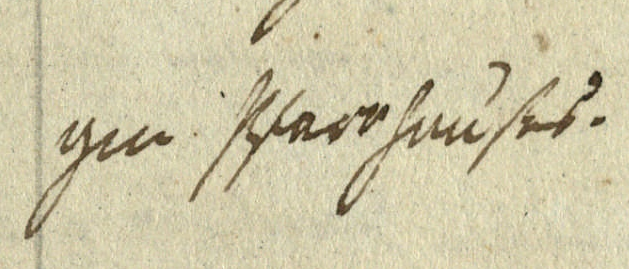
gen Pfarrhauses.
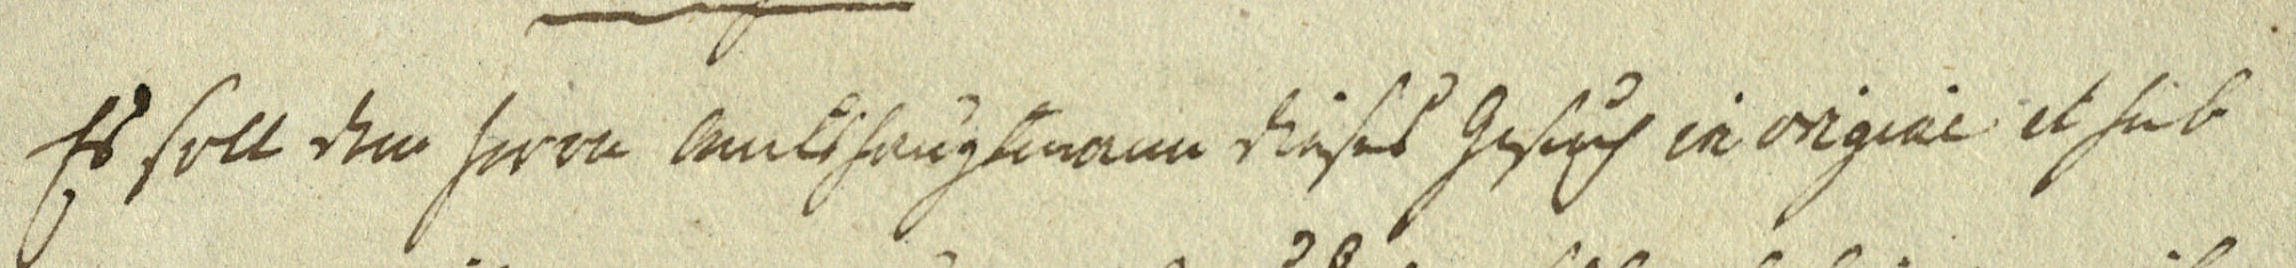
Es soll dem Herrn Amtshauptmann dieses Gesuch in origine et sub
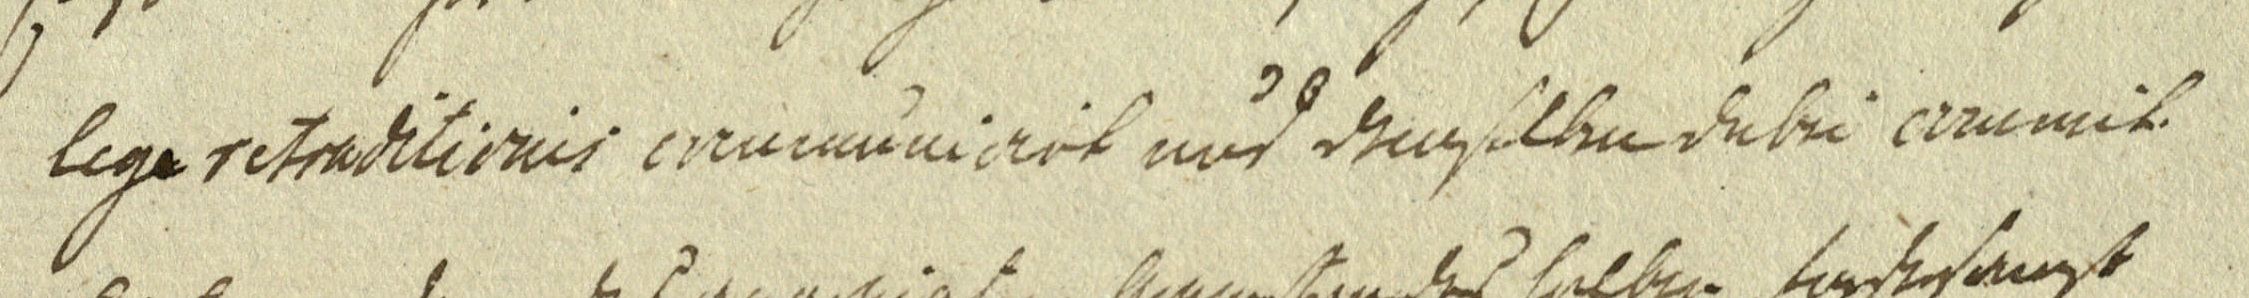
lege retraditionis communicirt und demselben dabei commit¬
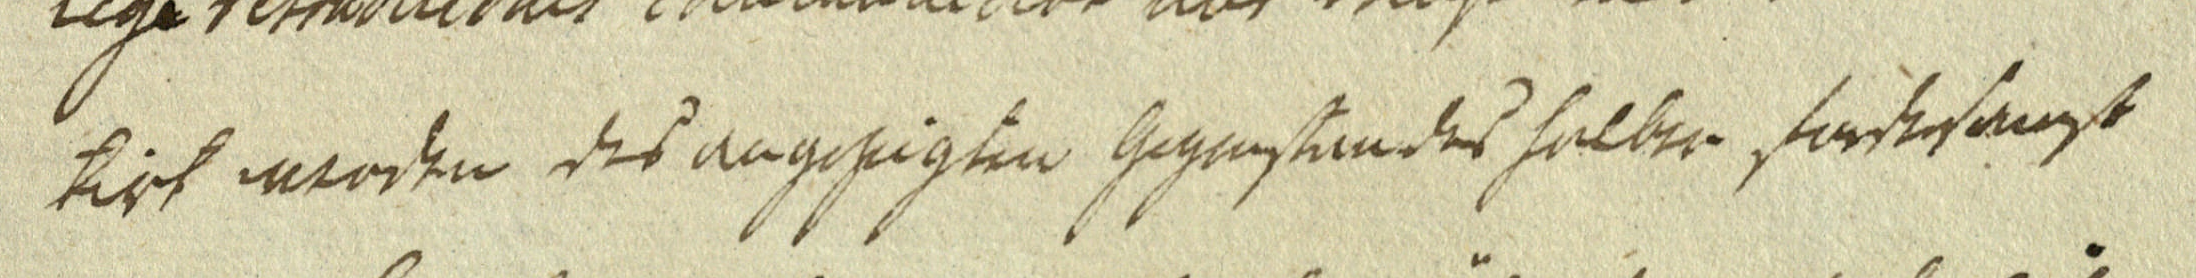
tirt werden des angezeigten Gegenstandes halber fordersamst
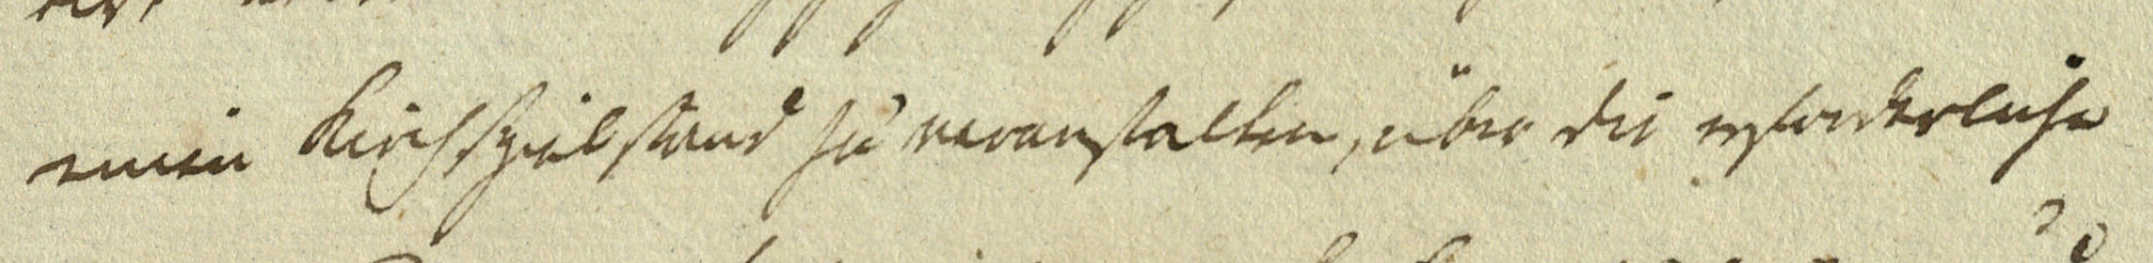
einen Kirchspielstand zu veranstalten, über die erforderliche
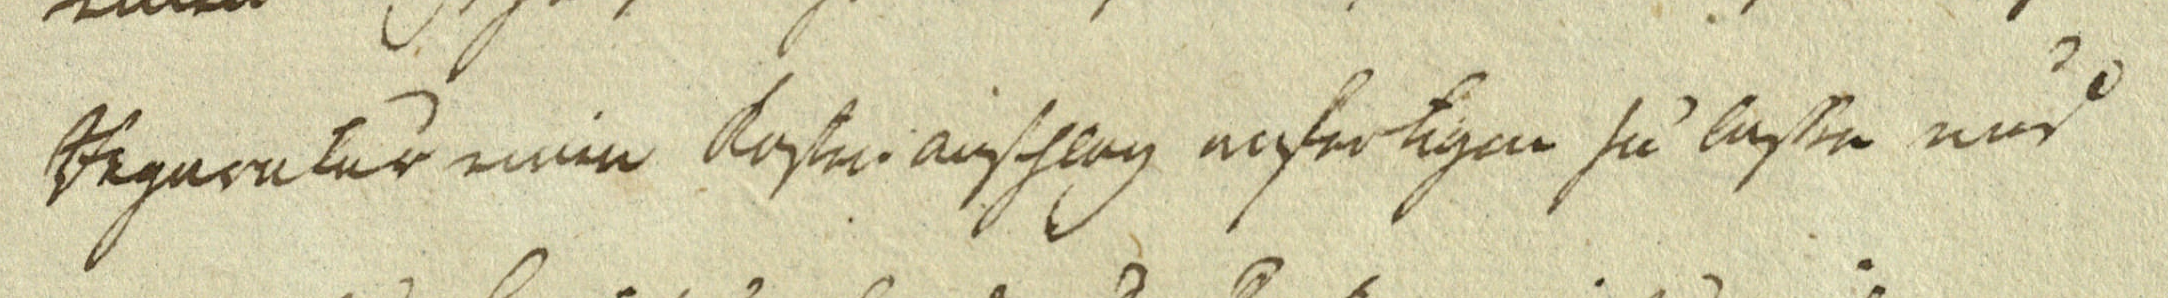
Reparatur einen Kostenanschlag anfertigen zu lassen und
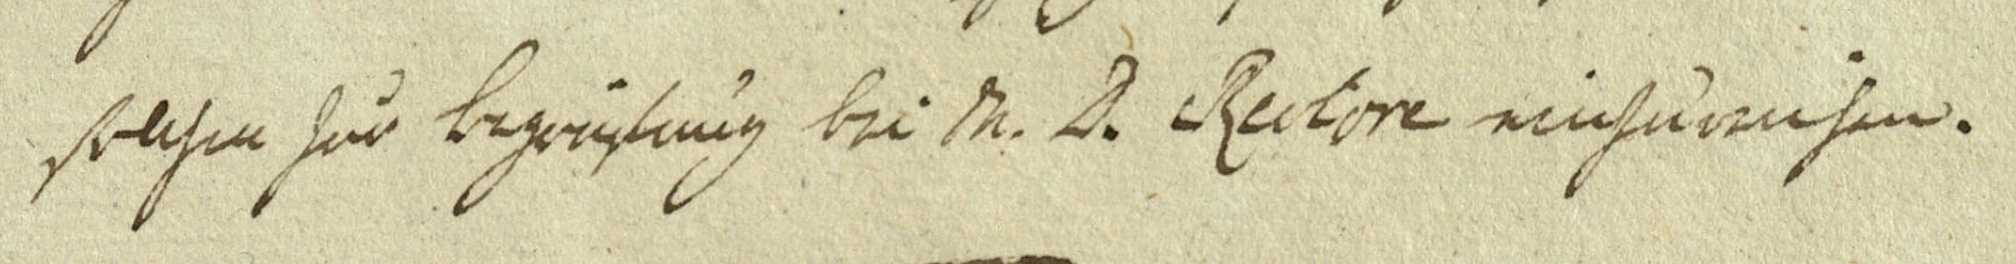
solchen zur Beprüfung bei M. D. Rectore einzureichen.
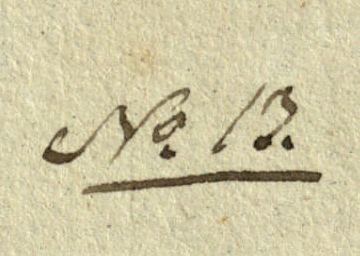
No 13.
